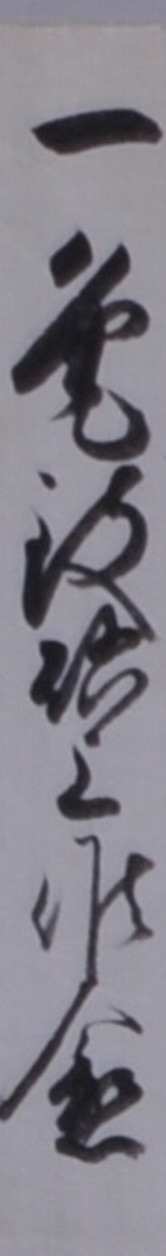一筆致啓上候愈
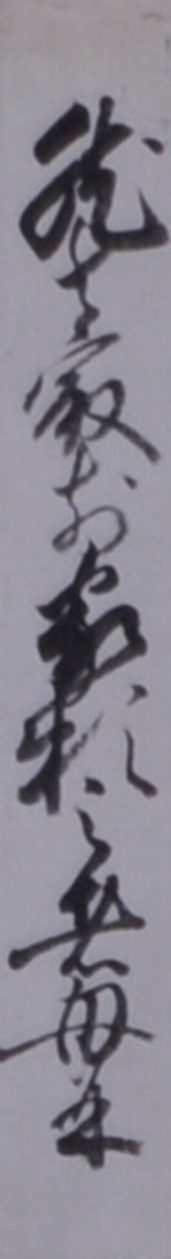然者最前家頼之者母并
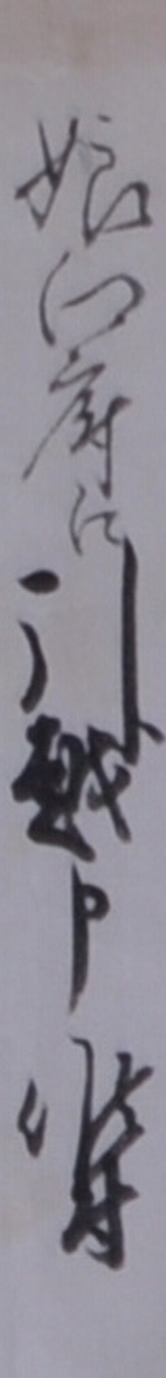娘江府え引越申候付
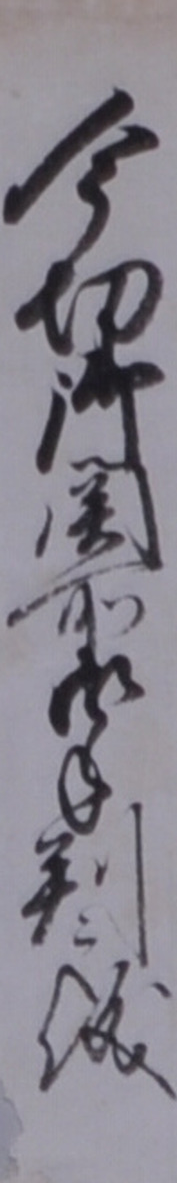今切御関所御手判之儀
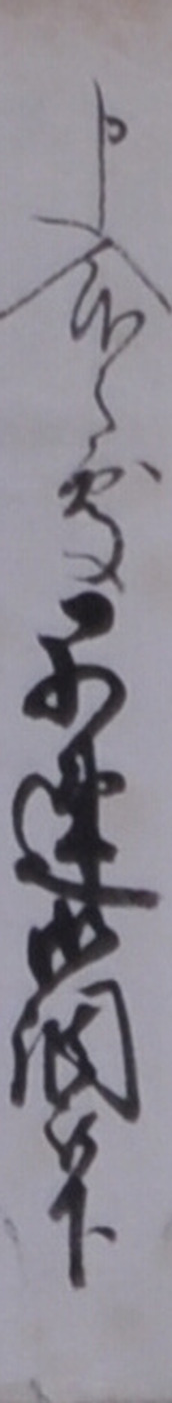申入候之處早速御聞被下
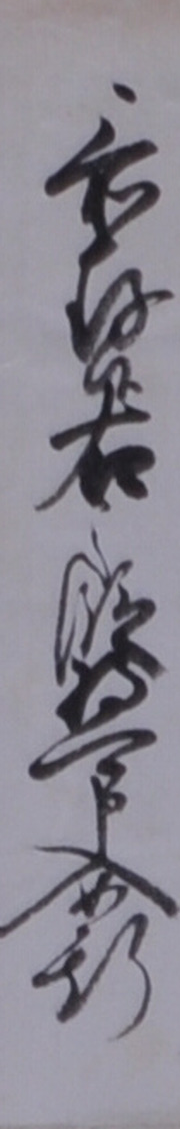忝存候右之段為可申入如斯
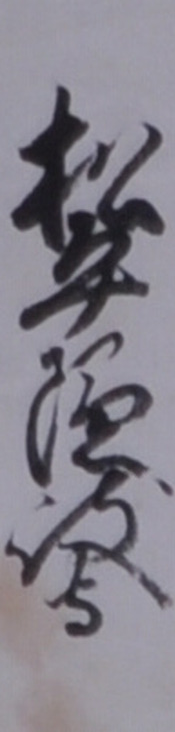松平隠岐守
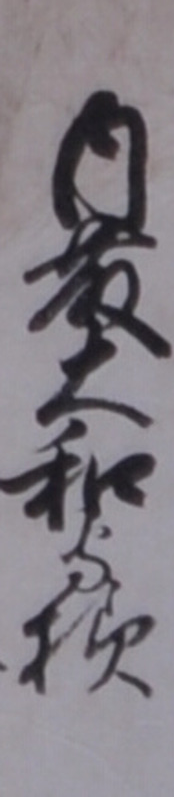内藤大和守様
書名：書状
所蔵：伊那市立高遠町図書館・合同会社AMANE
